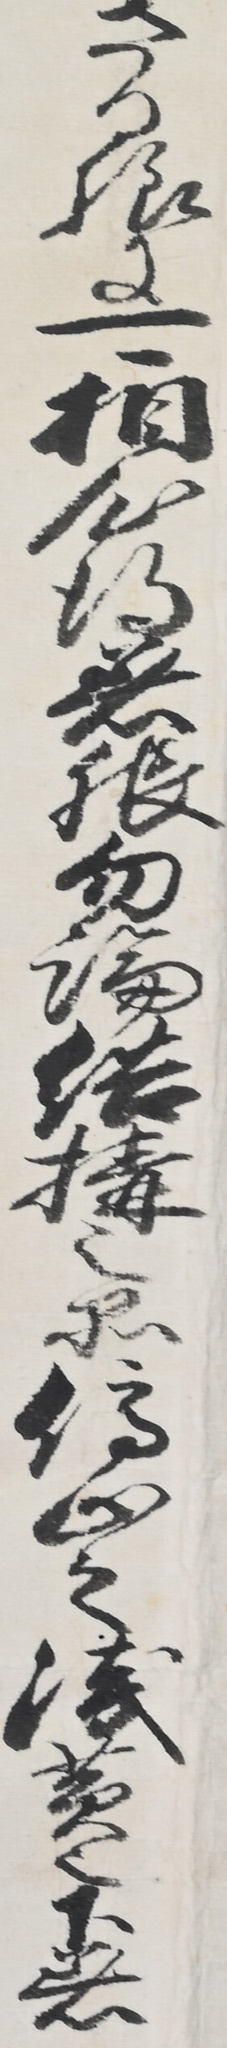さる様に可相心得着服勿論結構之品停止之浅黄之下着
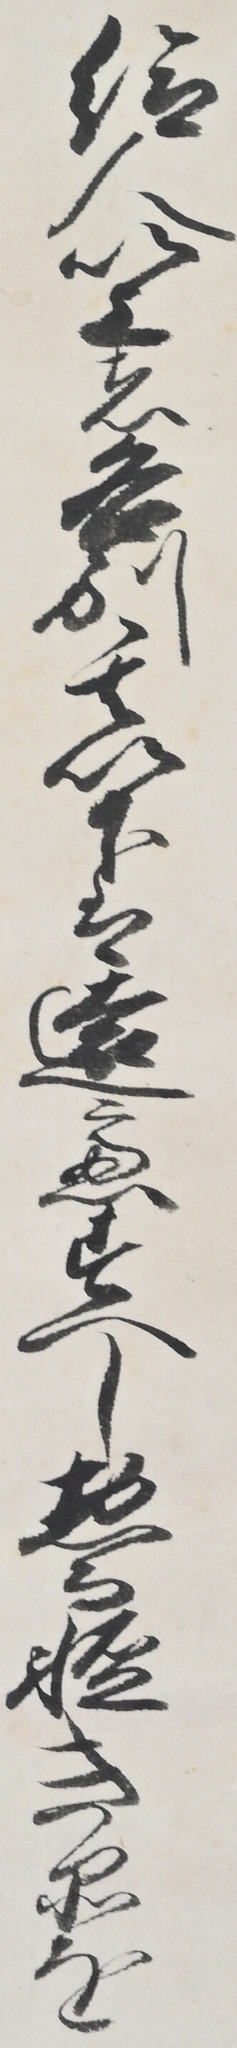給人以上者各別其以下は遠慮すへし惣而軽き品を
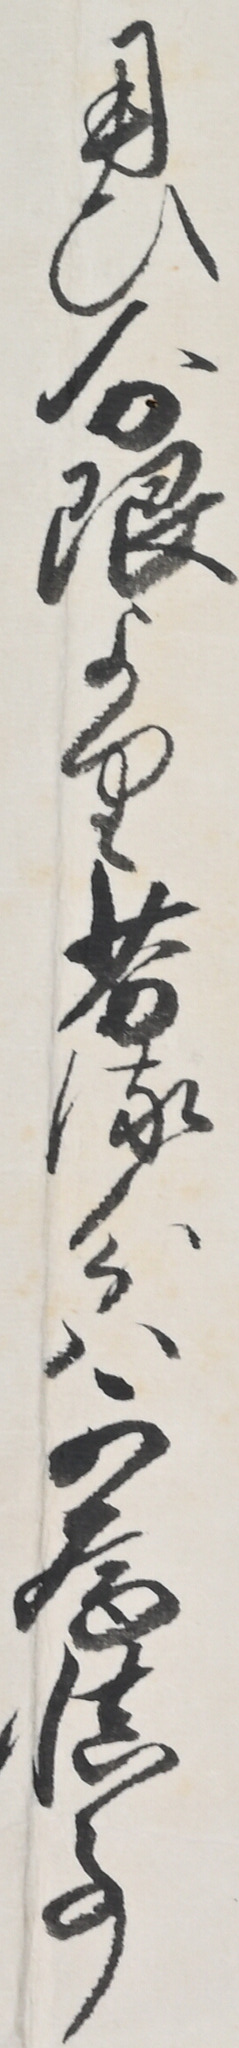用ひ分限より劣る分ハ可為慎事
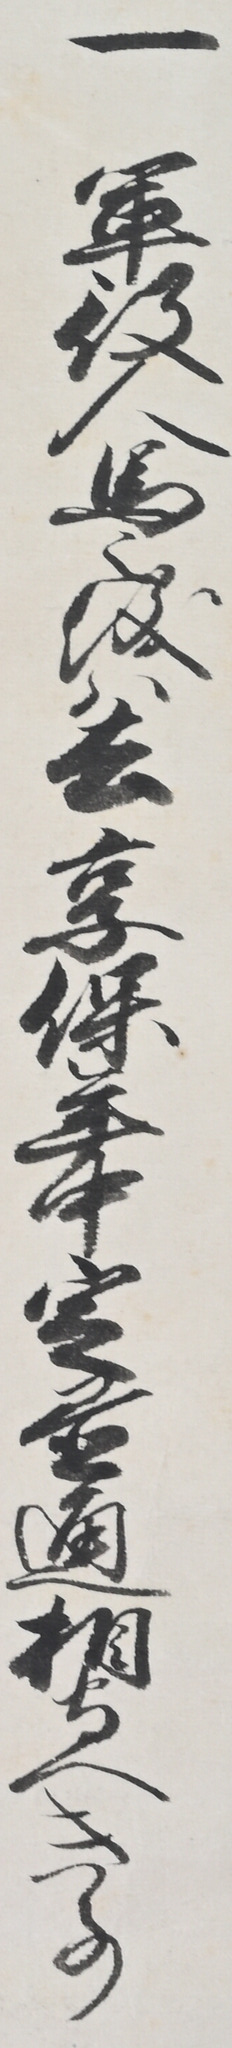一軍役人馬之儀ハ去享保年中定置通相守へき事
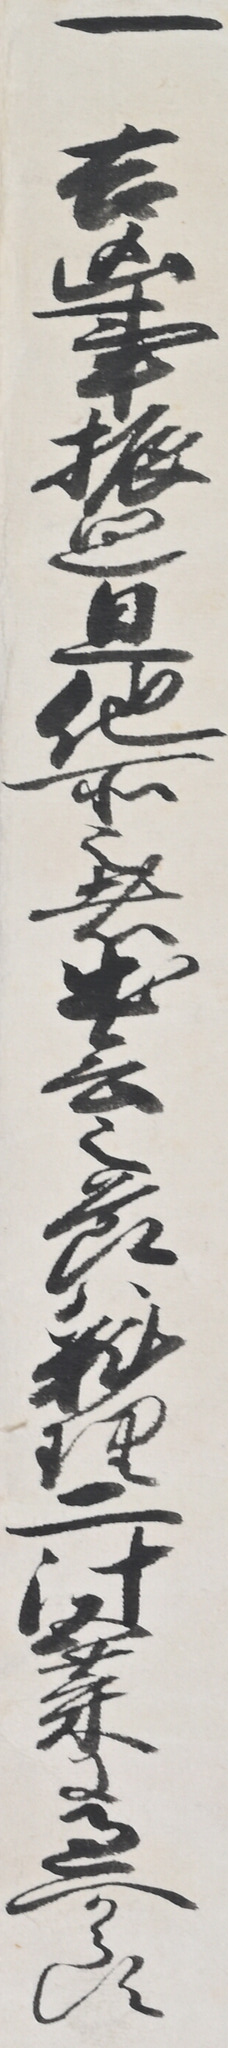一吉凶事振廻且他所之者出会之節ハ料理二汁五菜に過へからす
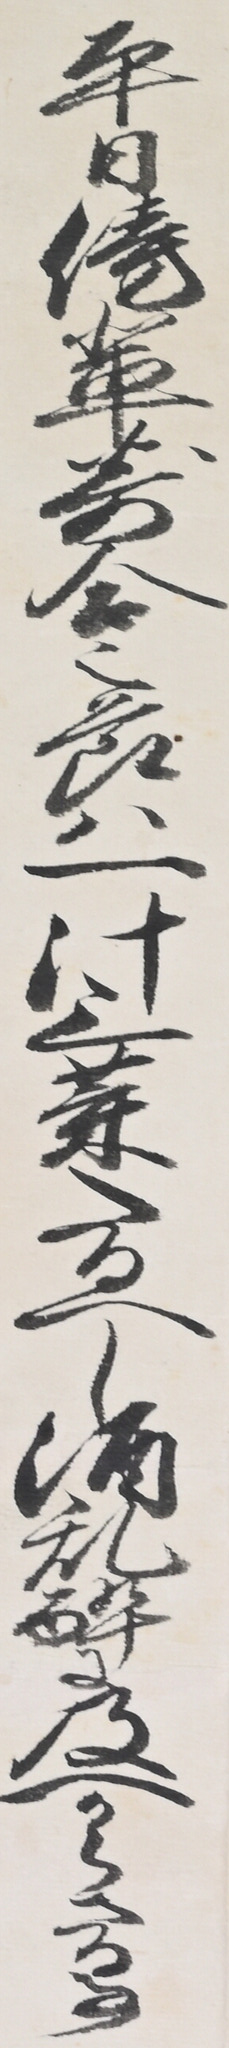平日傍輩寄合之節ハ一汁三菜たるへし酒乱酔に及へからさる事
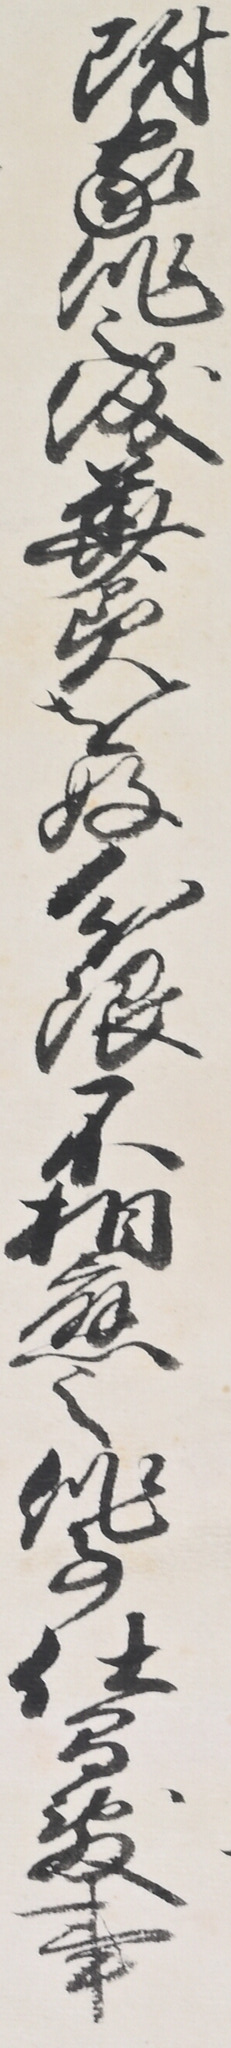附家作之儀華美を好分限不相応之作事仕間敷事
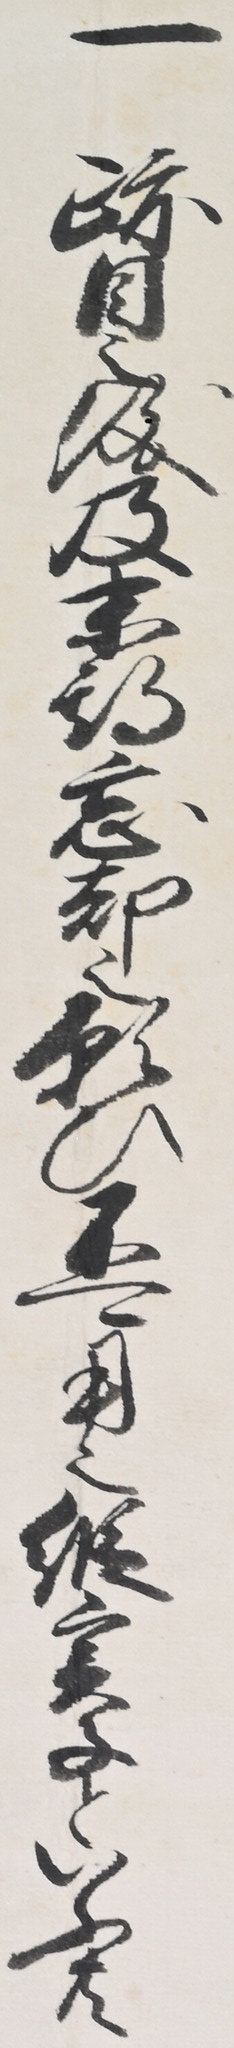一跡目之儀及末期忘却之願ひ不可用之縦実子といふ共
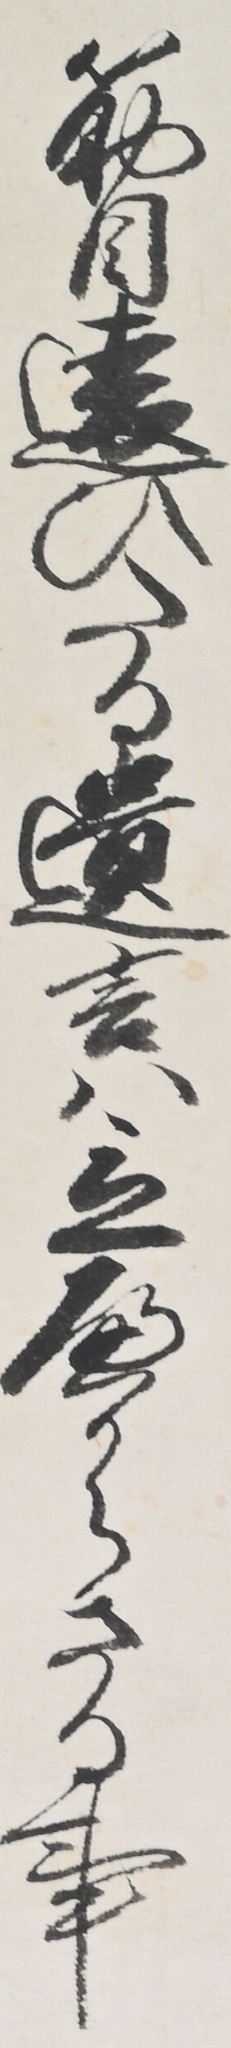筋目違ひたる遺言ハ立へからさる事
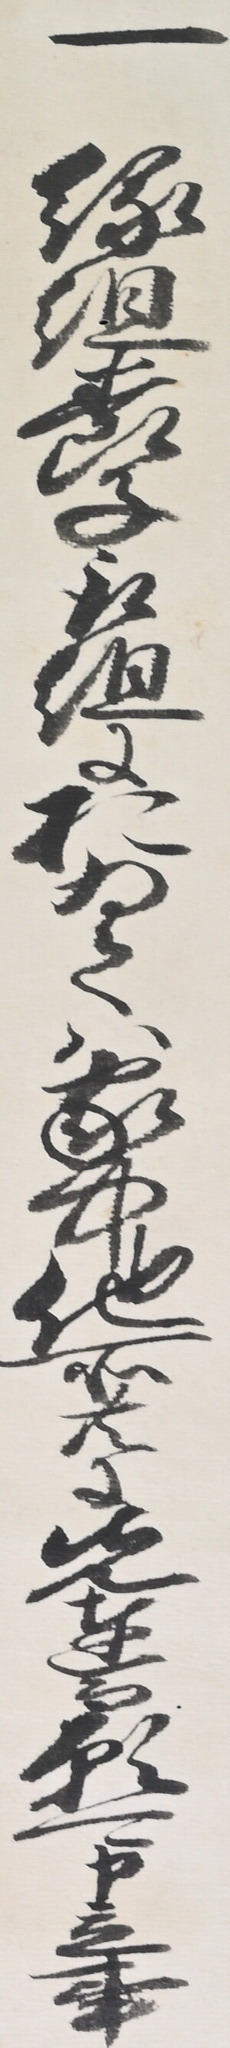一縁組養子取組におゐてハ家中他所共に先達而願可申立事

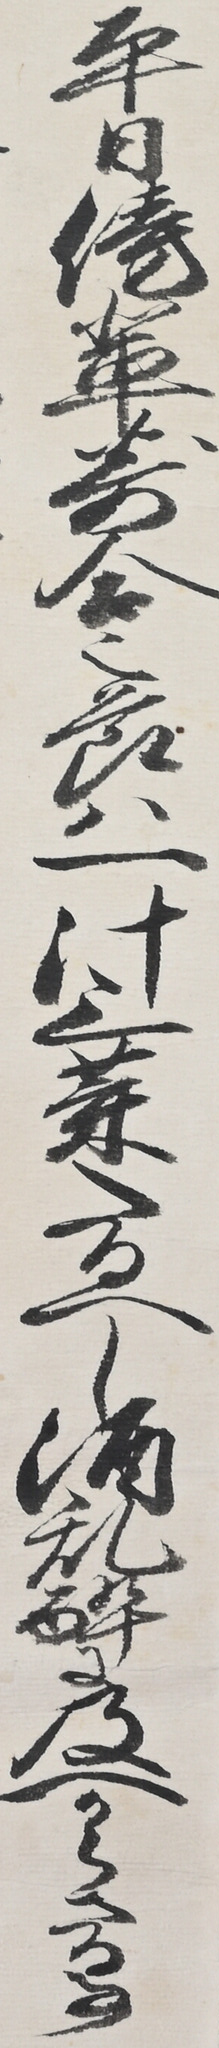平日傍輩寄合之節ハ一汁三菜たるへし酒乱酔に及へからさる事
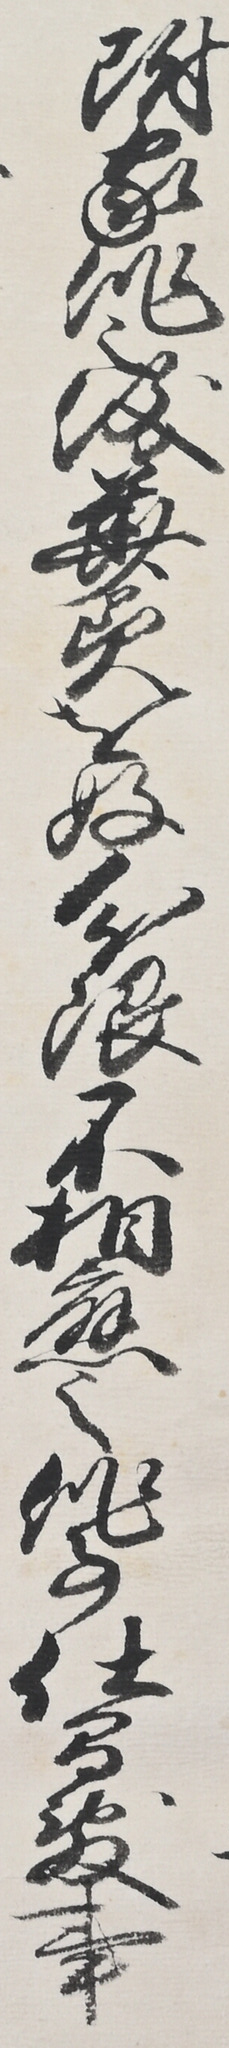附家作之儀華美を好分限不相応之作事仕間敷事
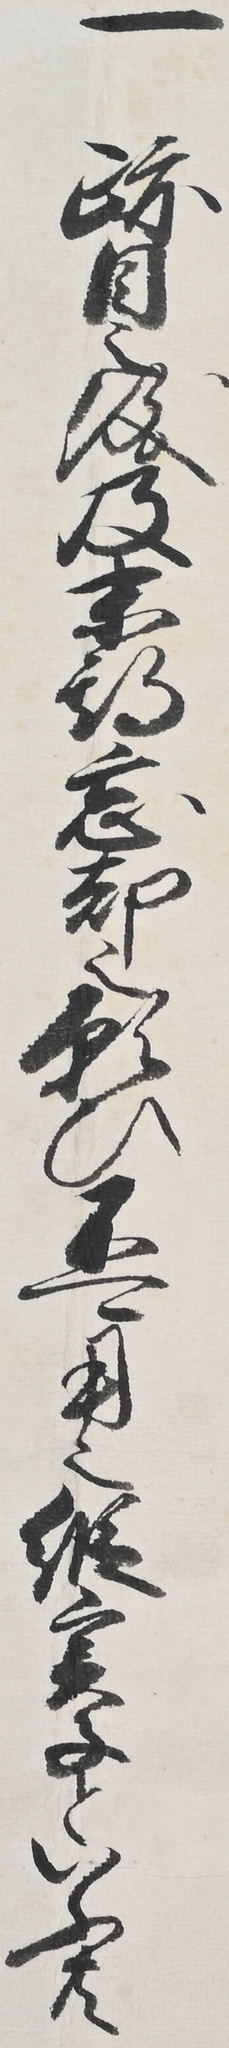一跡目之儀及末期忘却之願ひ不可用之縦実子といふ共
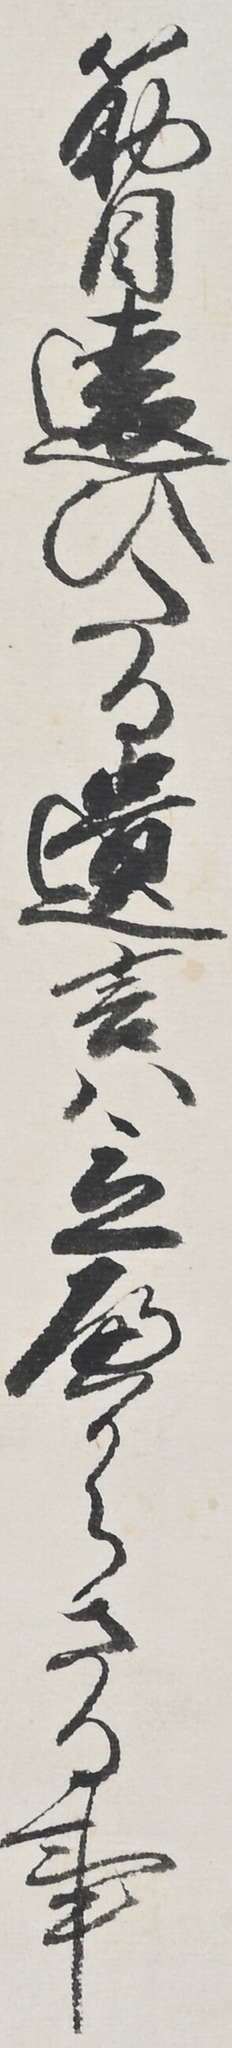筋目違ひたる遺言ハ立へからさる事
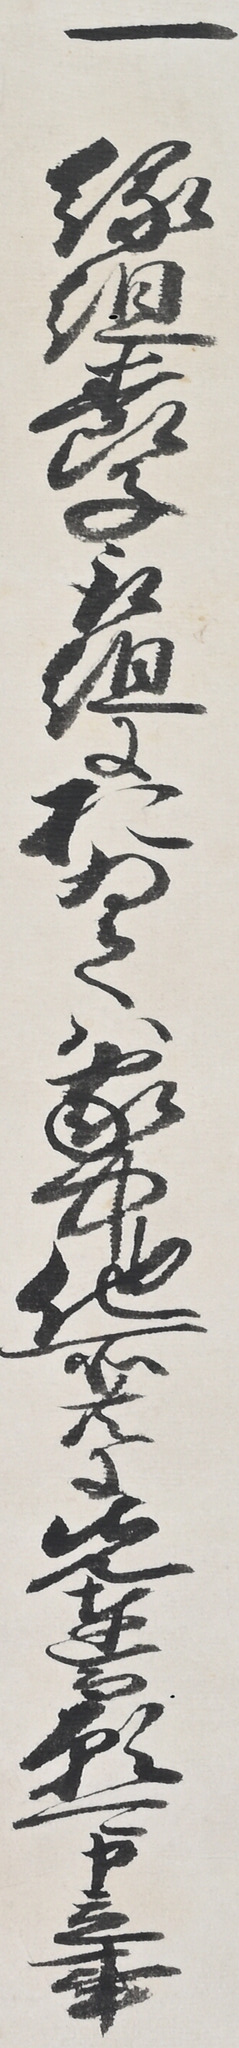一縁組養子取組におゐてハ家中他所共に先達而願可申立事
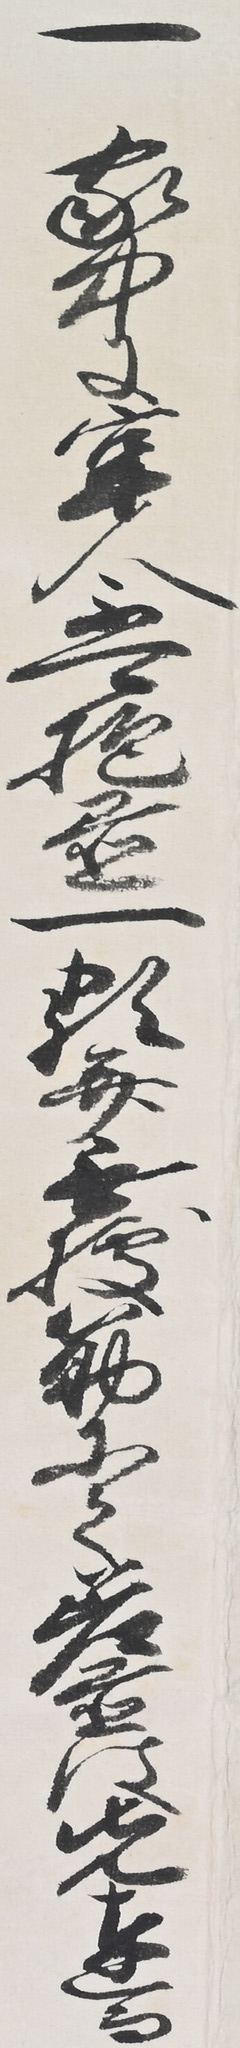一家中に牢人不可抱置一類幷無拠筋にて差置は先達而
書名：御条目〔同文二通一括〕
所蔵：伊那市立高遠町図書館・合同会社AMANE
